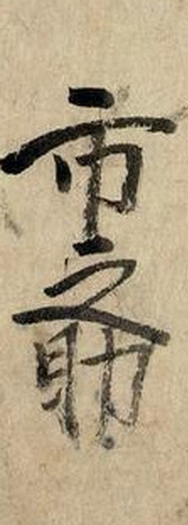市之助
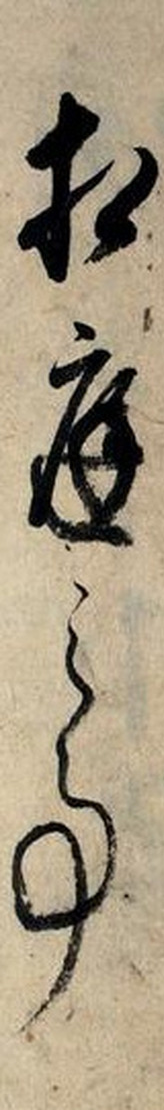相庭之事
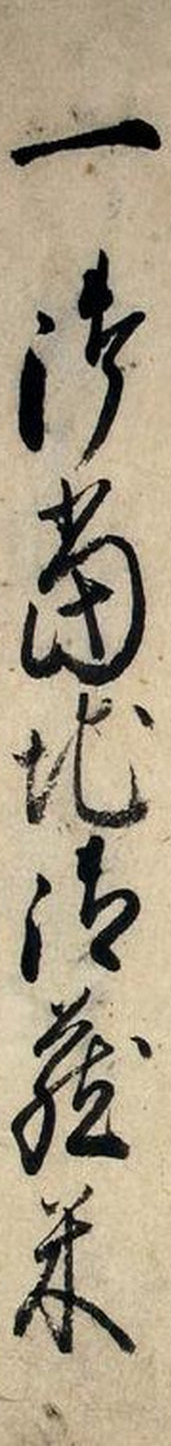一御当地御蔵米
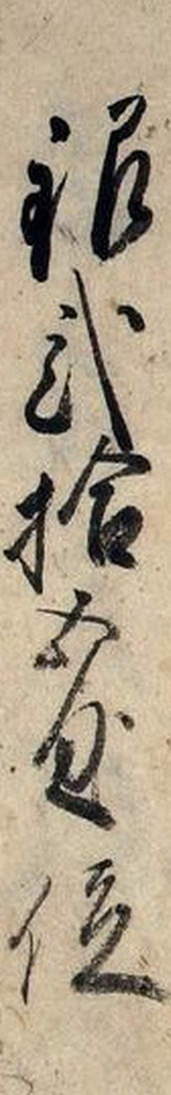銀弐拾五匁位

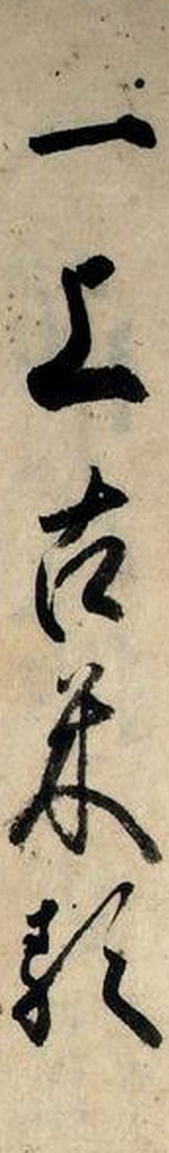一上古米類
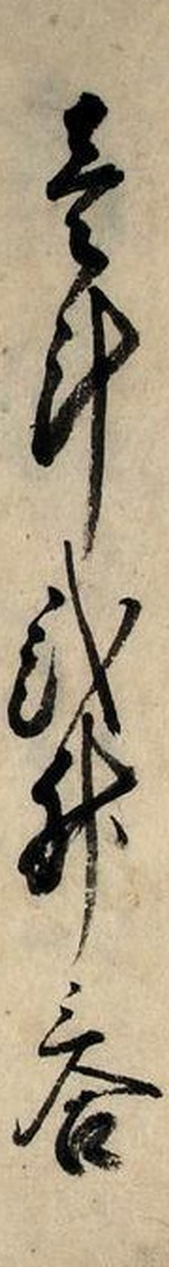壱斗弐升三合
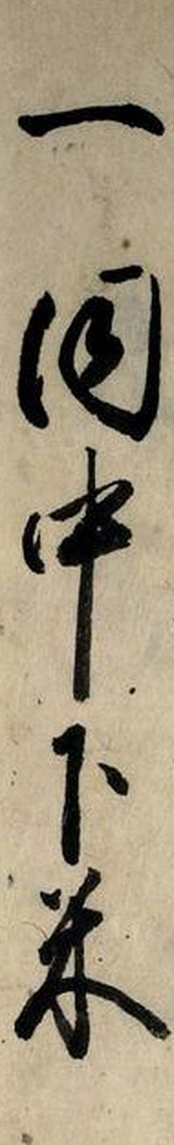一同中下米
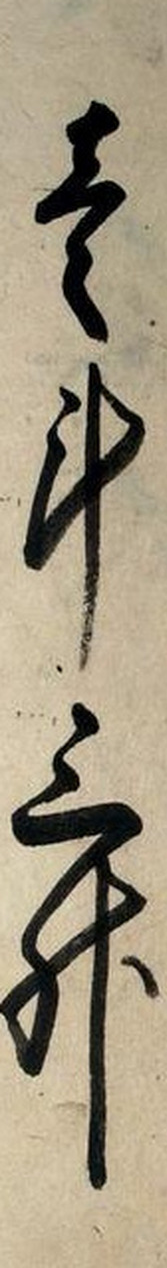壱斗三升
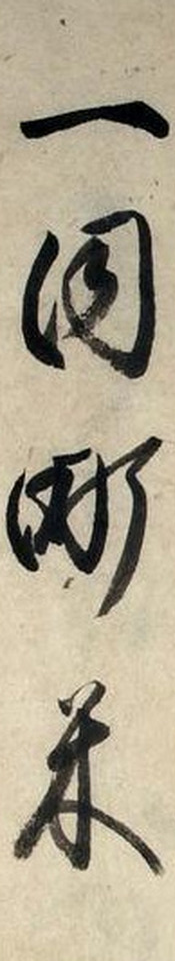一同町米
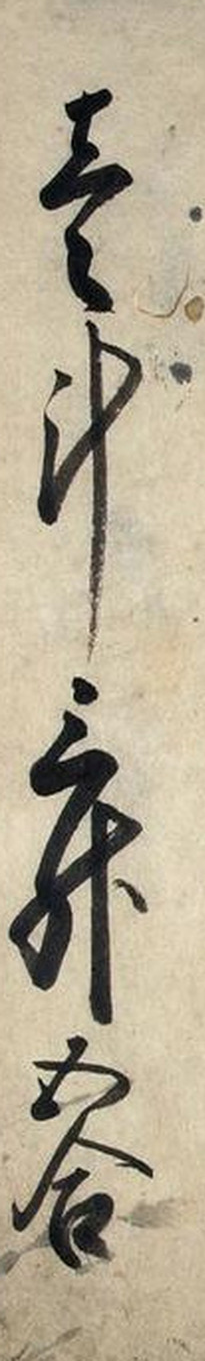壱斗三升五合

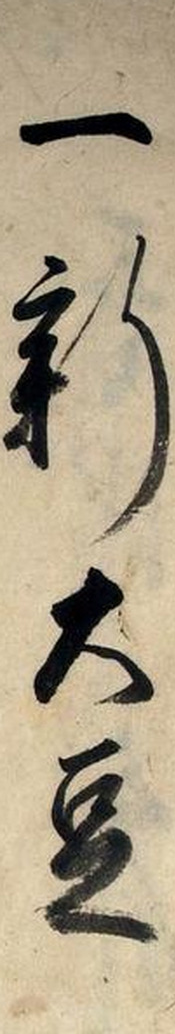一新大豆
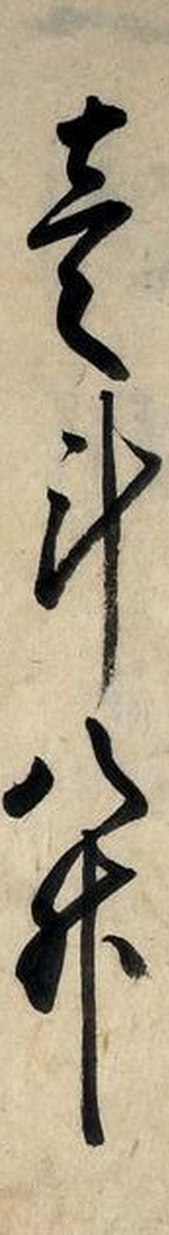壱斗八升
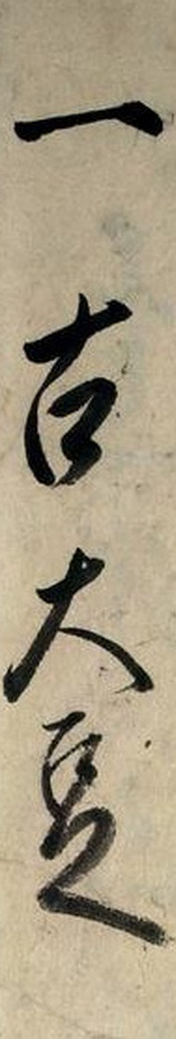一古大豆
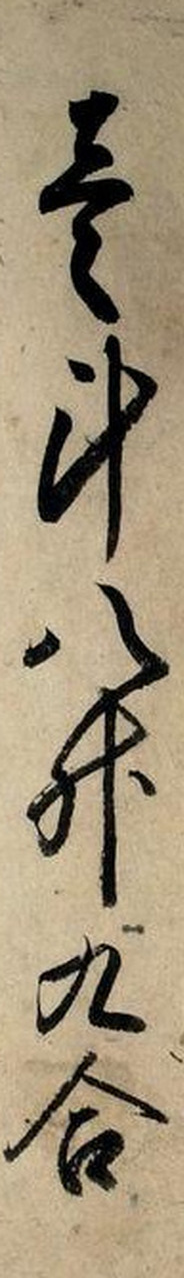壱斗八升九合
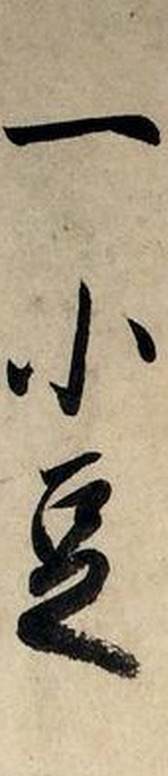一小豆
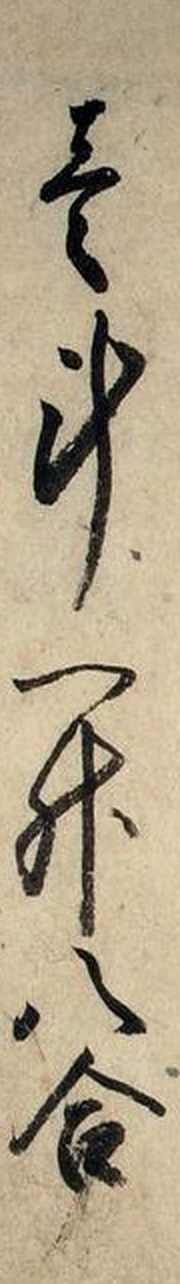壱斗一升八合
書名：御手本（手習、いろは・数字、「名頭之事」「親戚字尽」「相庭之…
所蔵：福井県文書館 Fukui Prefectural Archives
